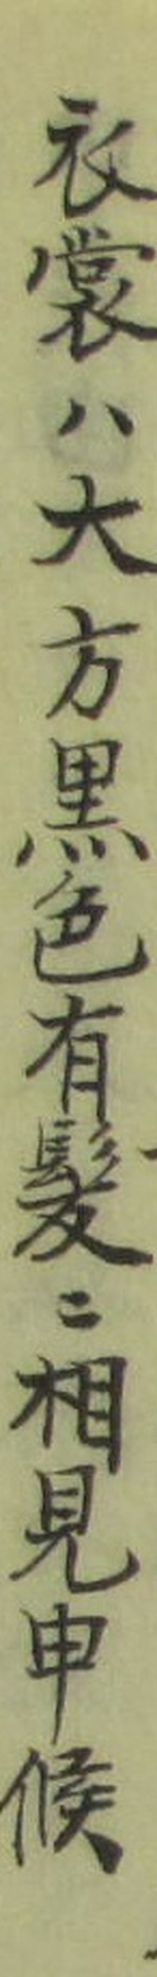衣裳ハ大方黒色有髪ニ相見申候
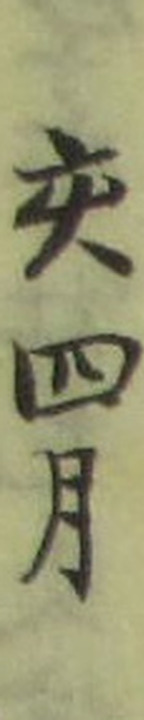亥四月
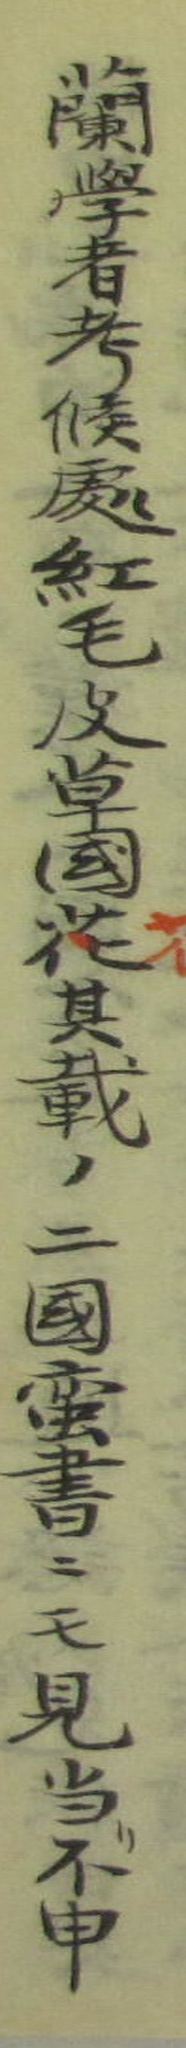蘭学者考候處紅毛皮草國花其載ノ二國蛮書ニモ見当不申

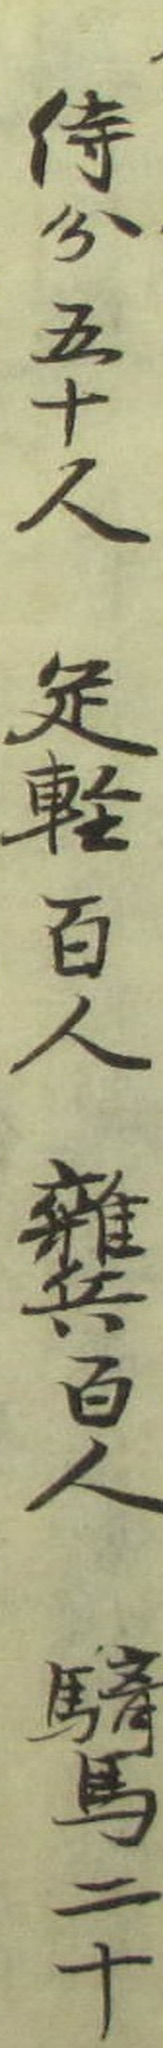侍分五十人足軽百人雜兵百人騎馬二十
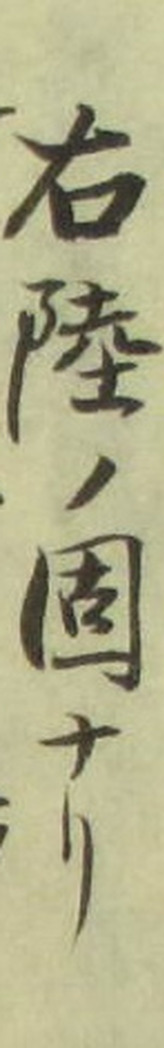右陸ノ固ナリ
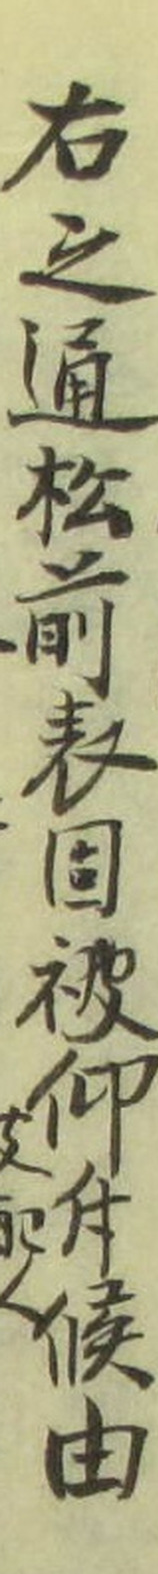右之通松前表固被仰付候由
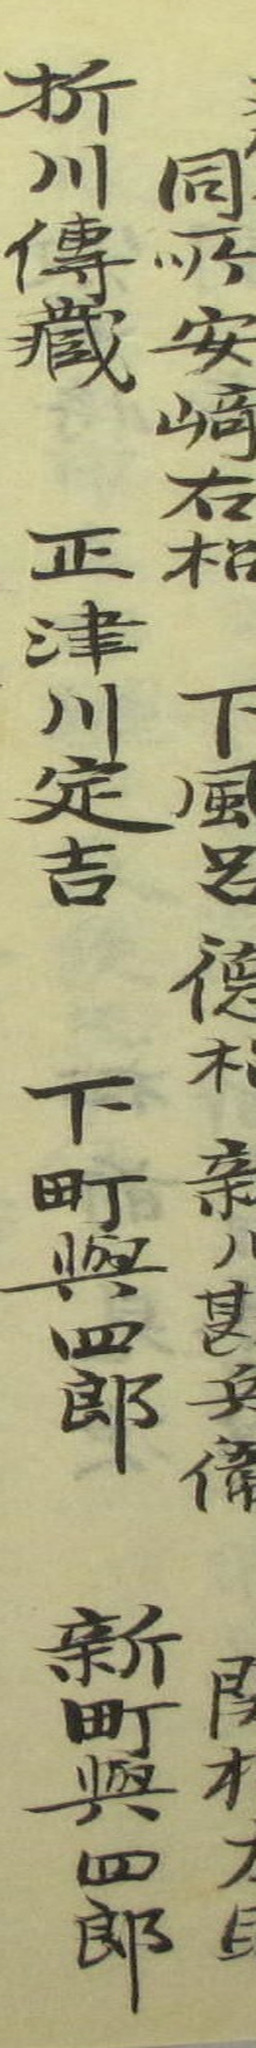折川傳蔵正津川定吉下町與四郎新町與四郎
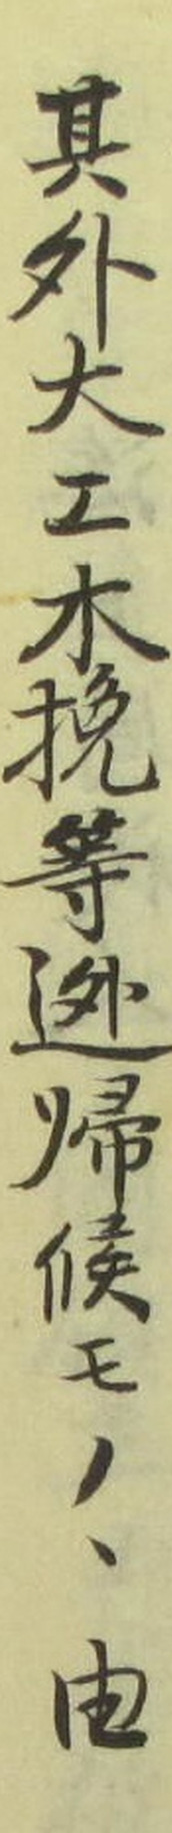其外大工木挽等逃帰候モノヽ由
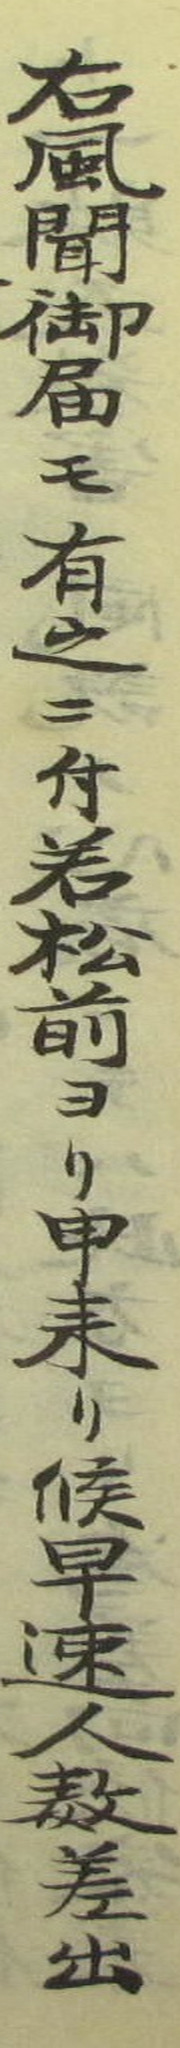右風聞御届モ有之ニ付若松前ヨリ申来リ候早速人數差出
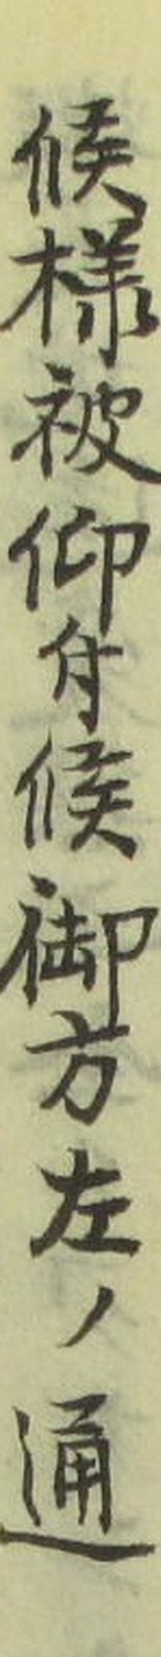候様被仰付候御方左ノ通
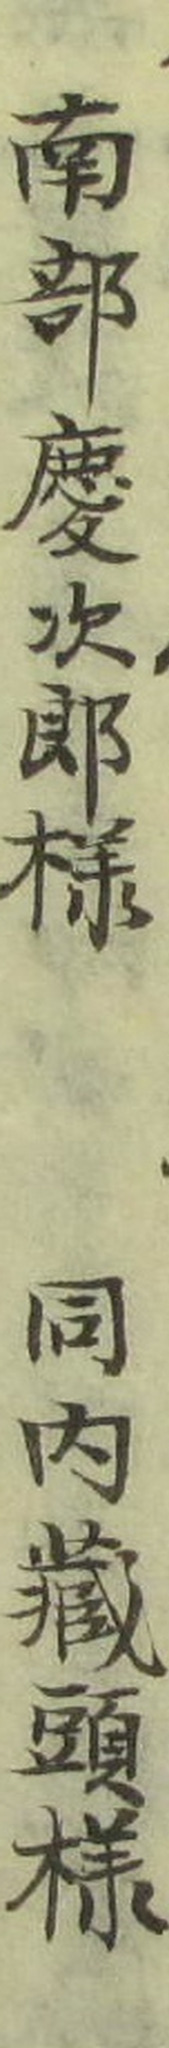南部慶次郎様同内蔵頭様
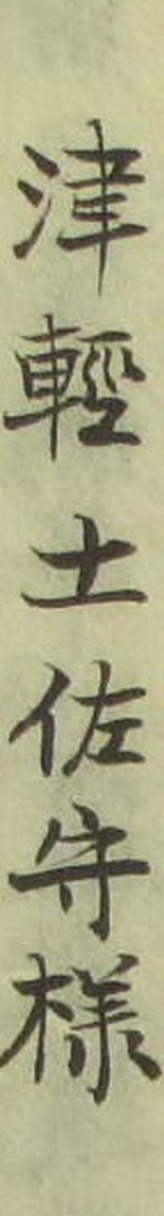津軽土佐守様
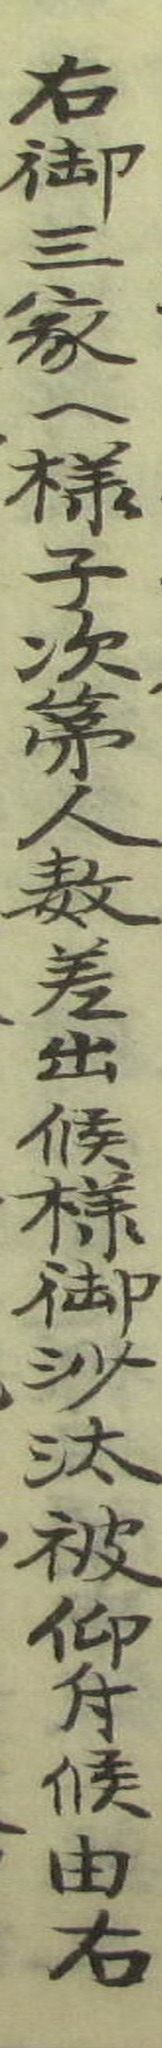右御三家ヘ様子次第人數差出候様御沙汰被仰付候由右
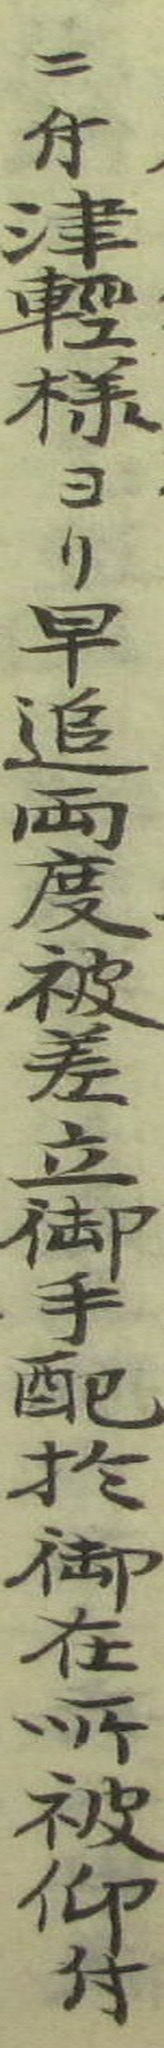ニ付津軽様ヨリ早追両度被差立御手配於御在所被仰付
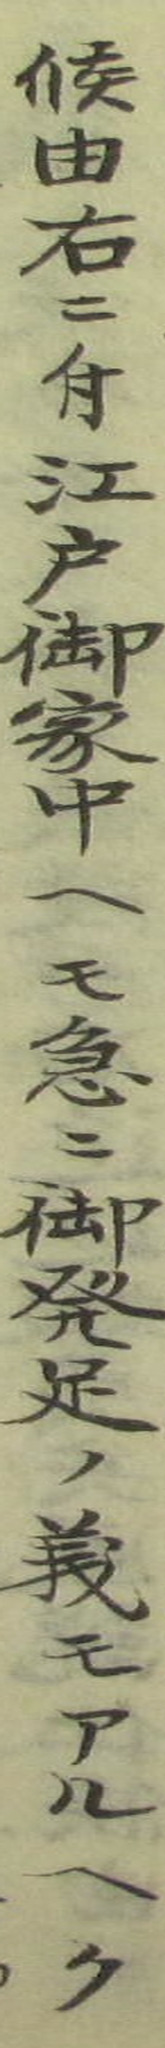候由右ニ付江戸御家中ヘモ急ニ御発足ノ義モアルヘク
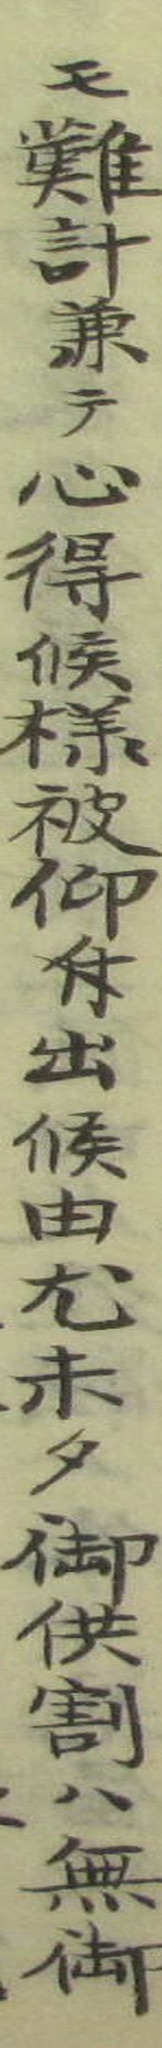モ難計兼テ心得候様被仰付出候由尤未タ御供割ハ無御
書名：異国船漂着記 外二
